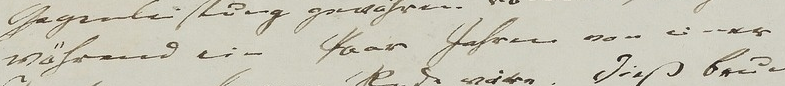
während ein Paar Jahren von einer
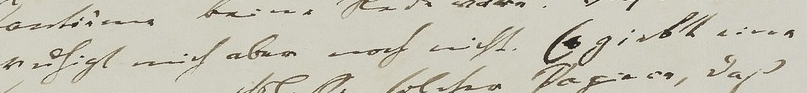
ruhigt mich aber noch nicht. Es giebt eine
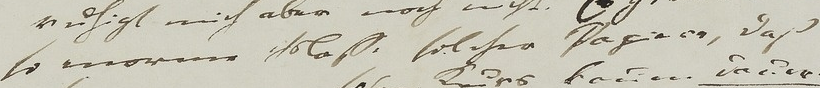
so enorme Masse solcher Papiere, daß
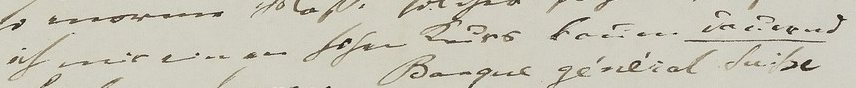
ich mir einen hohen Kurs kaum dauernd
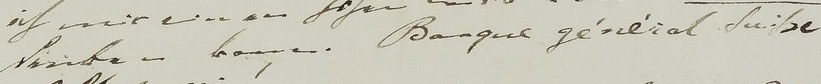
denken kann. Banque général Suisse
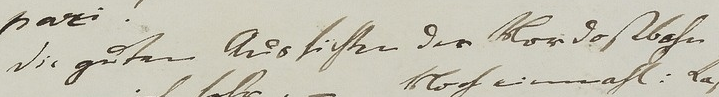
Die guten Aussichten der Nordostbahn
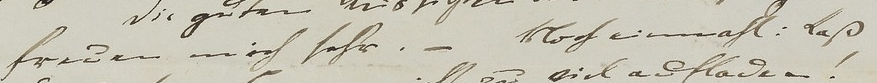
freuen mich sehr. – Noch einmahl: Laß
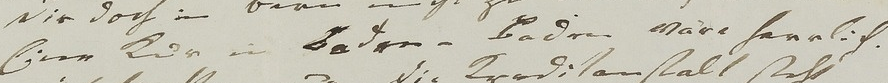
Eine Kur in Baden-Baden wäre herrlich.
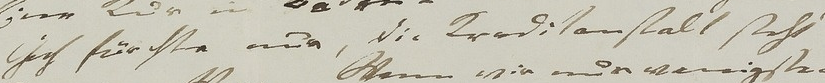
Ich fürchte nur, die Kreditanstalt steht
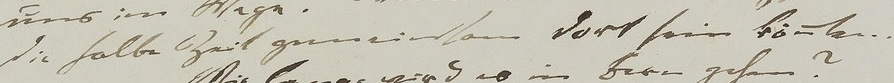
die halbe Zeit gemeinsam dort sein könnten.
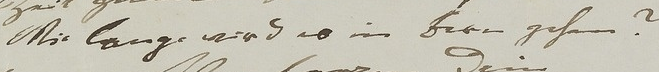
Wie lange wird es in Bern gehen?
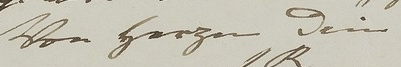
Von Herzen Dein
